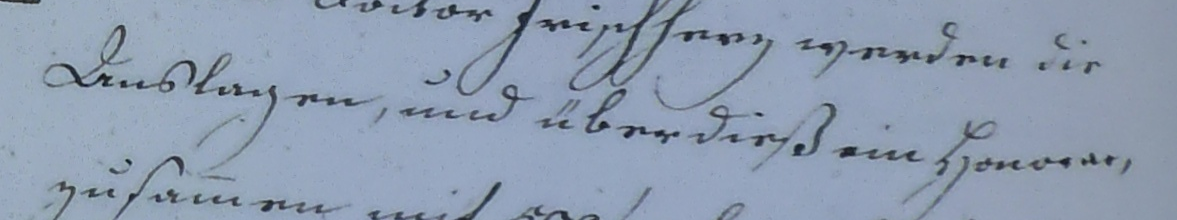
Auslagen, und über dieß ein Honorar,
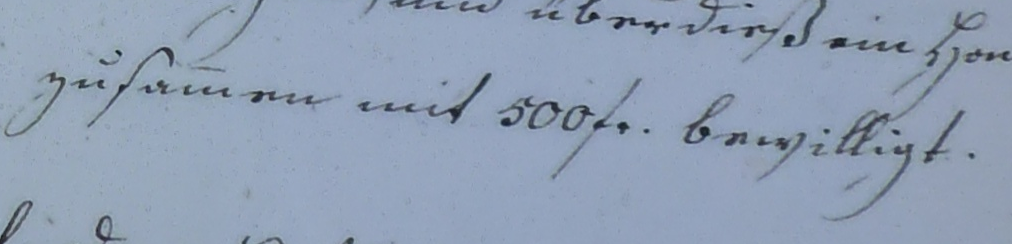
zusam̅en mit 500fr. bewilligt.
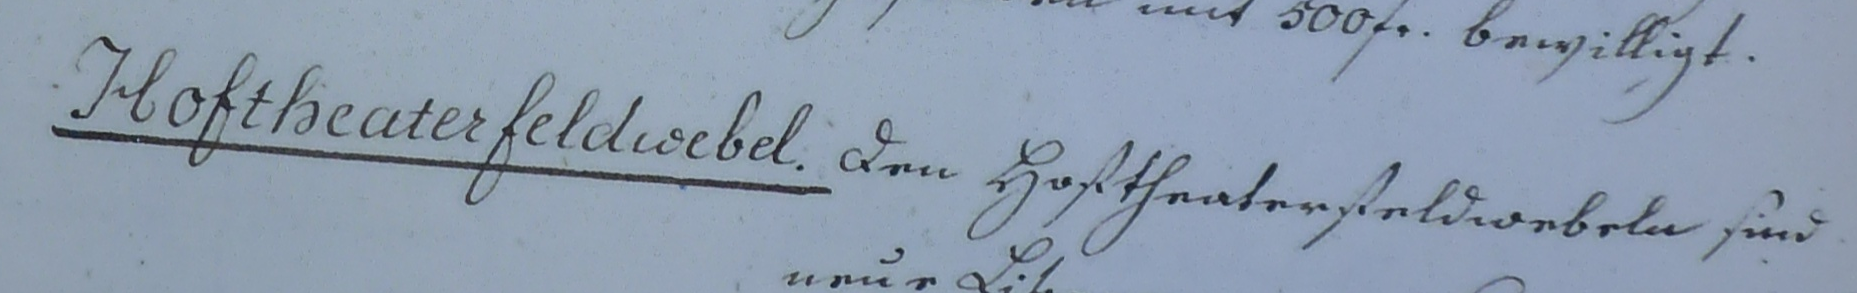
Hoftheaterfeldwebel. Den Hoftheaterfeldwebeln sind
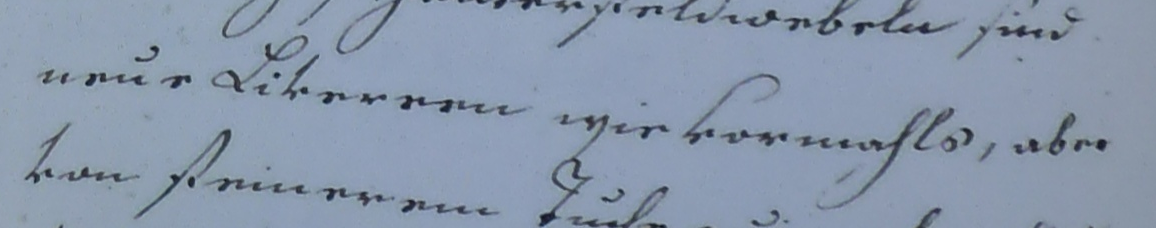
neue Livereen wie vormahls, aber
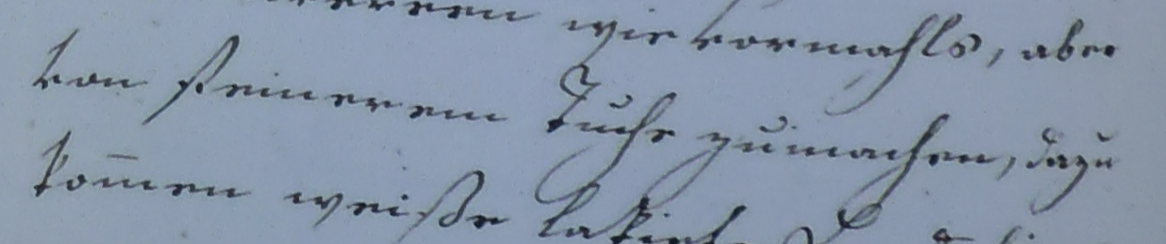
von feinerem Tuche zumachen, dazu
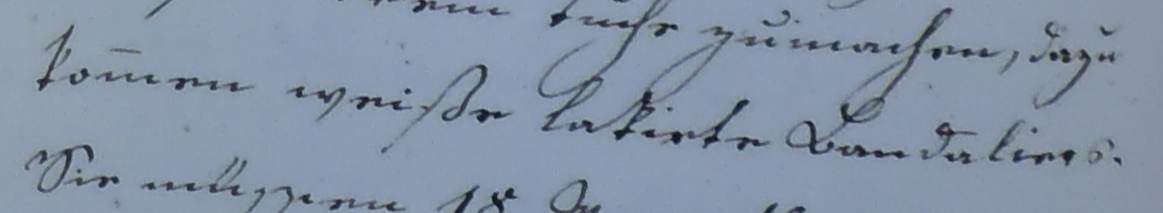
kom̅en weiße lakirte Bandaliers.
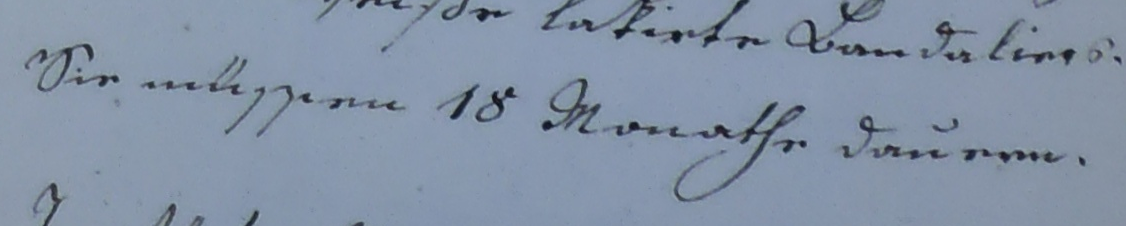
Sie müssen 18 Monathe dauern.
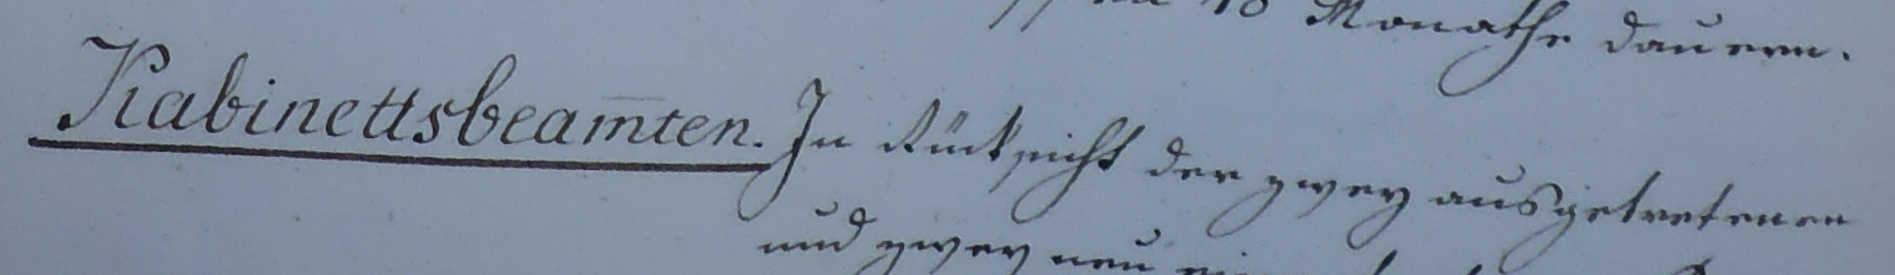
Kabinettsbeam̅ten. In Rücksicht der zwey ausgetretenen
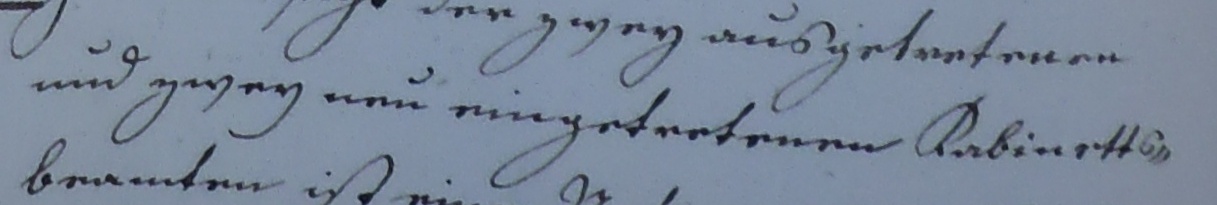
und zwey neu eingetretenen Kabinetts¬
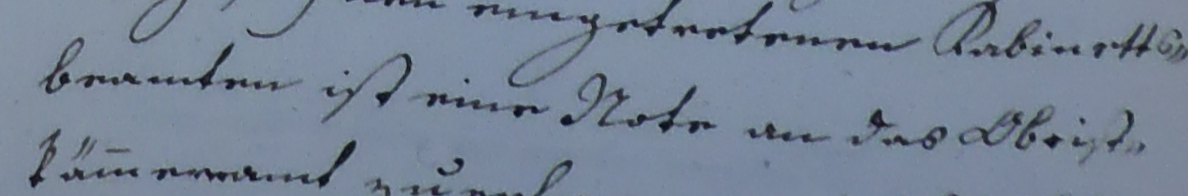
beamten ist eine Note an das Obrist¬
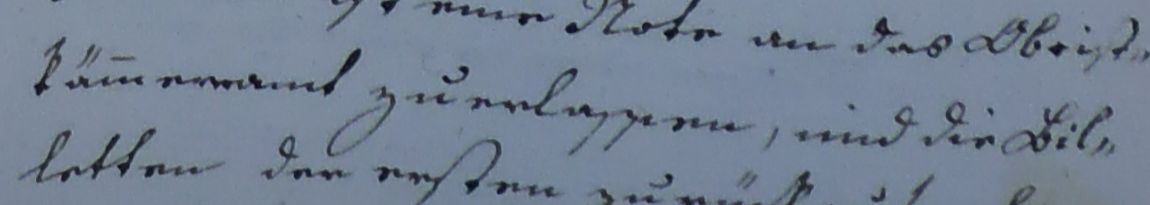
käm̅erramt zuerlassen, und die Bil¬
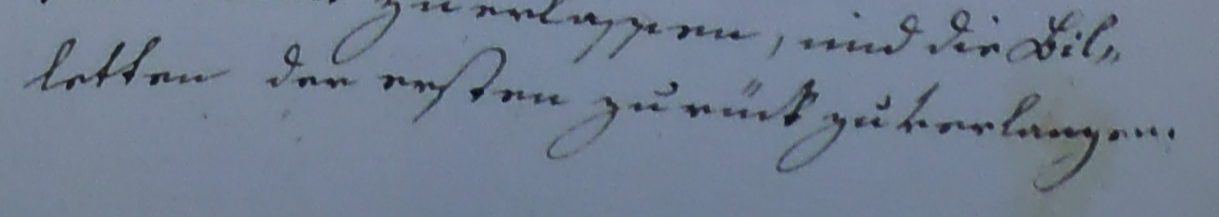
letten der ersten zurück zuverlangen.
